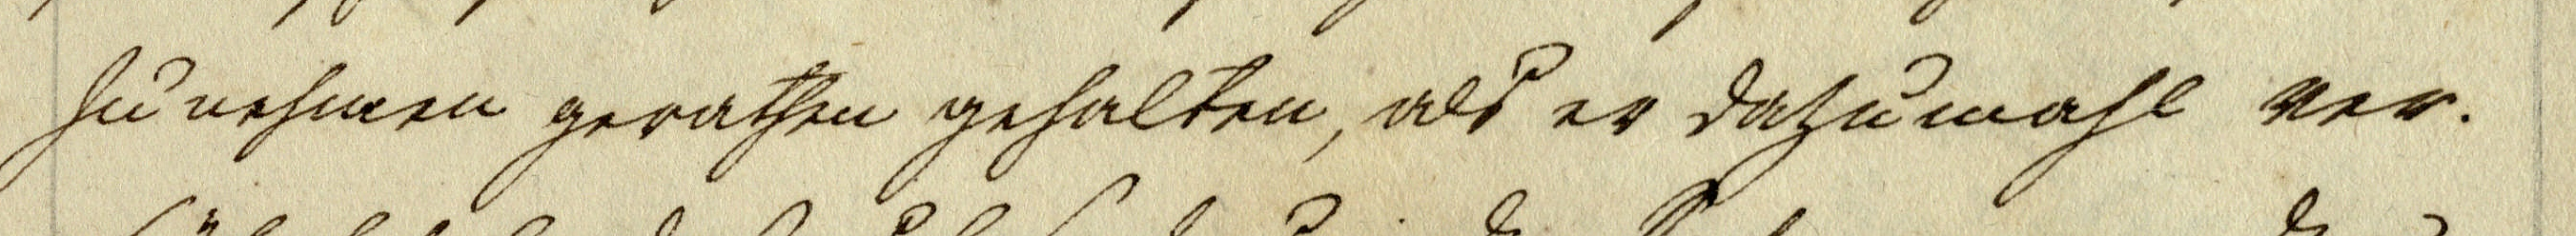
zu nehmen gerathen gehalten, als er dazumahl ver¬
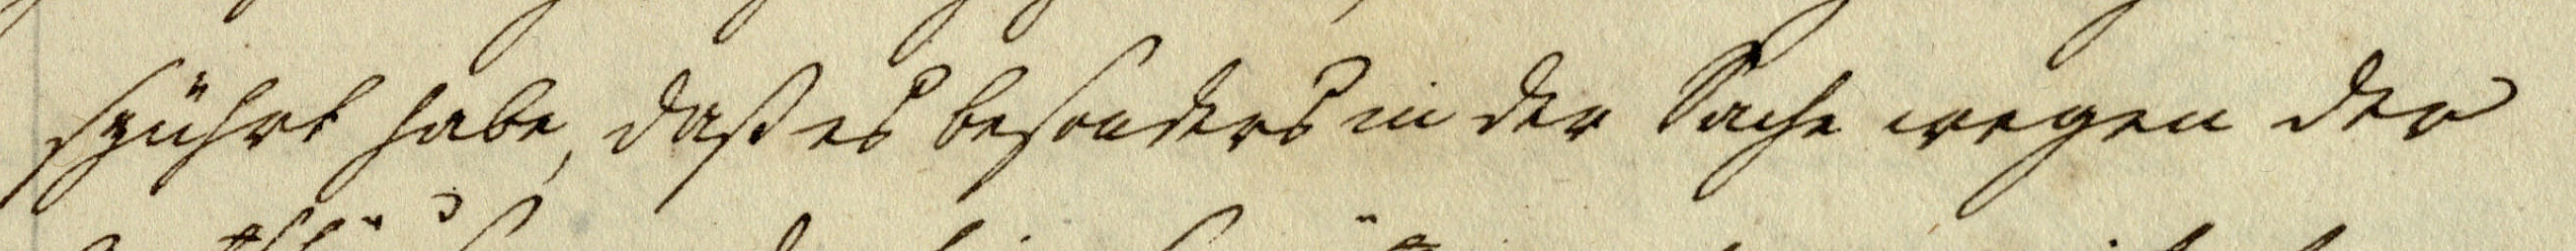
spührt habe daß es besonders in der Sache wegen der
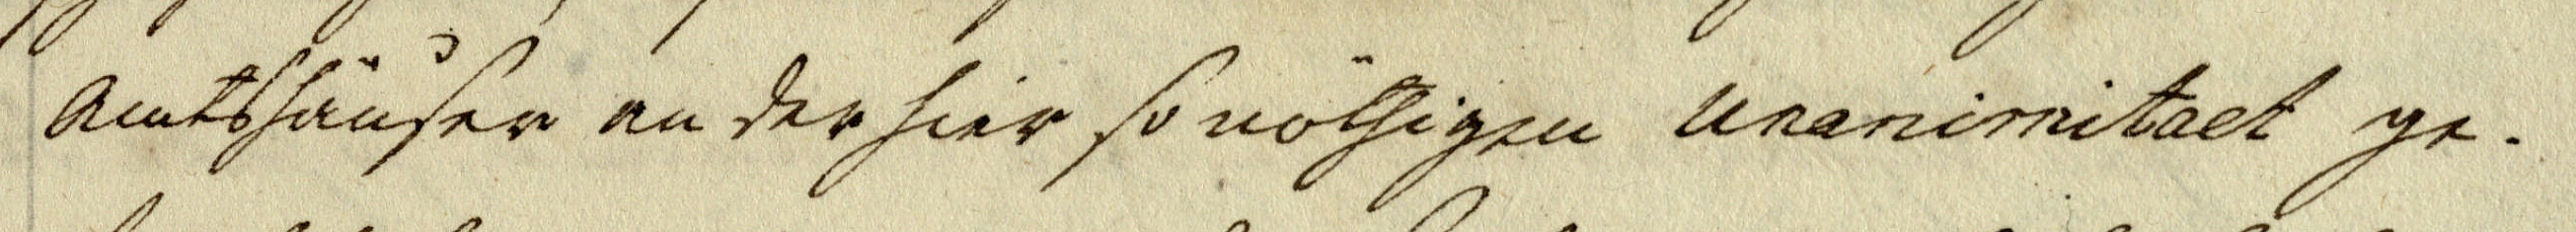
Amtshäuser an der hier so nöthigen Unanimitaet ge¬
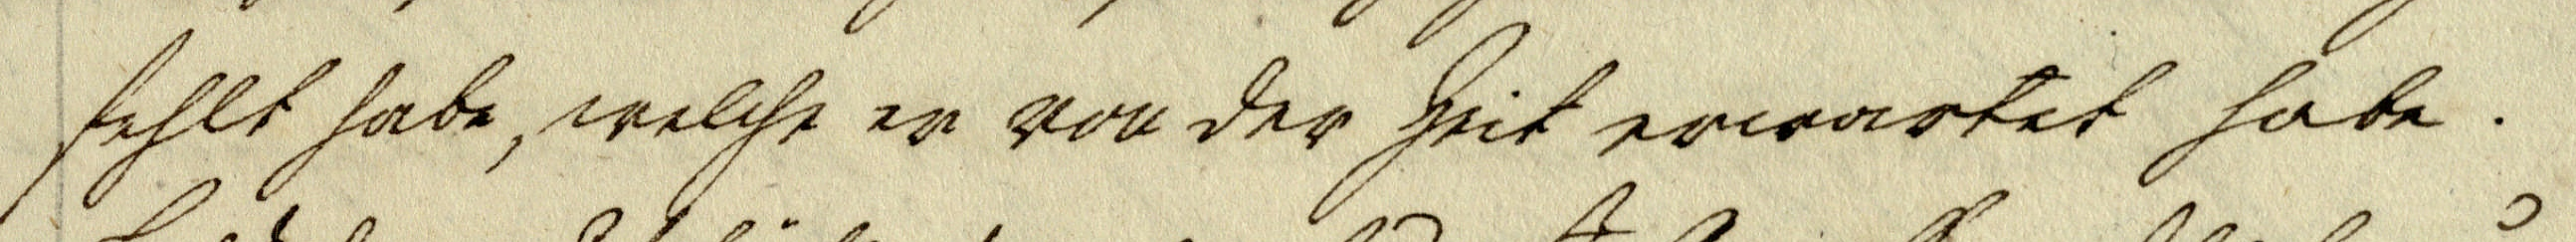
fehlt habe, welche er von der Zeit erwartet habe.
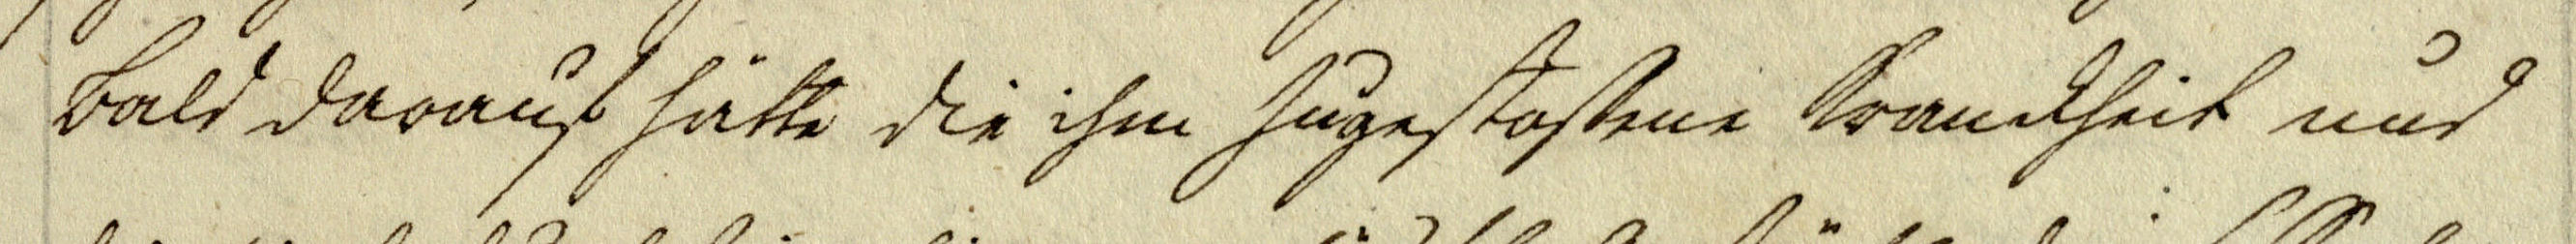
Bald darauf hätte die ihm zugestossene Kranckheit und
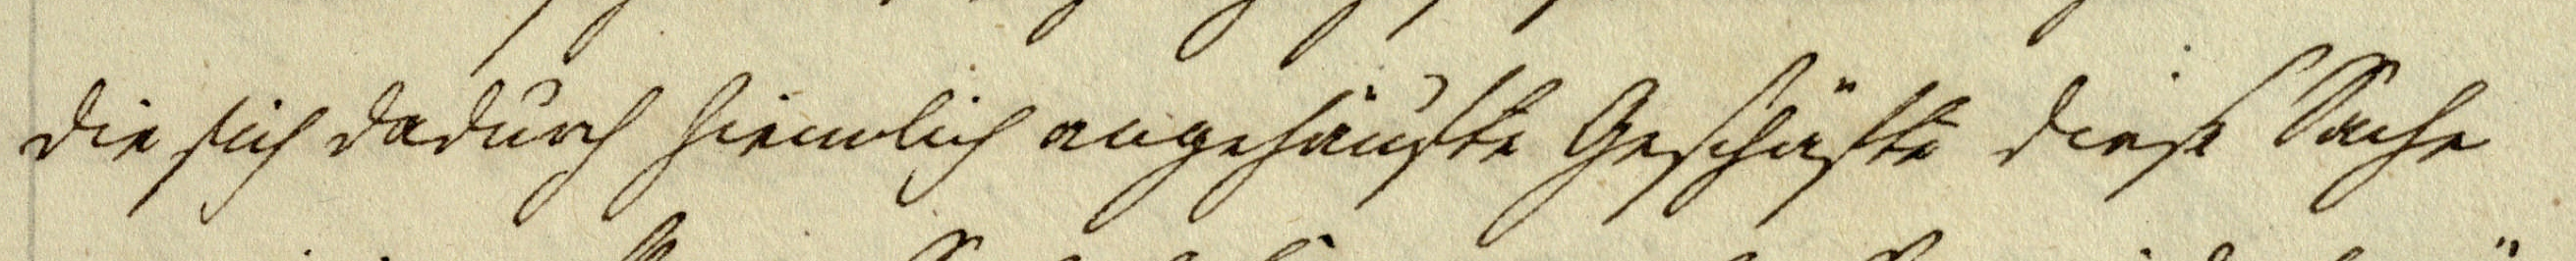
die sich dadurch ziemlich angehäufte Geschäfte diese Sache
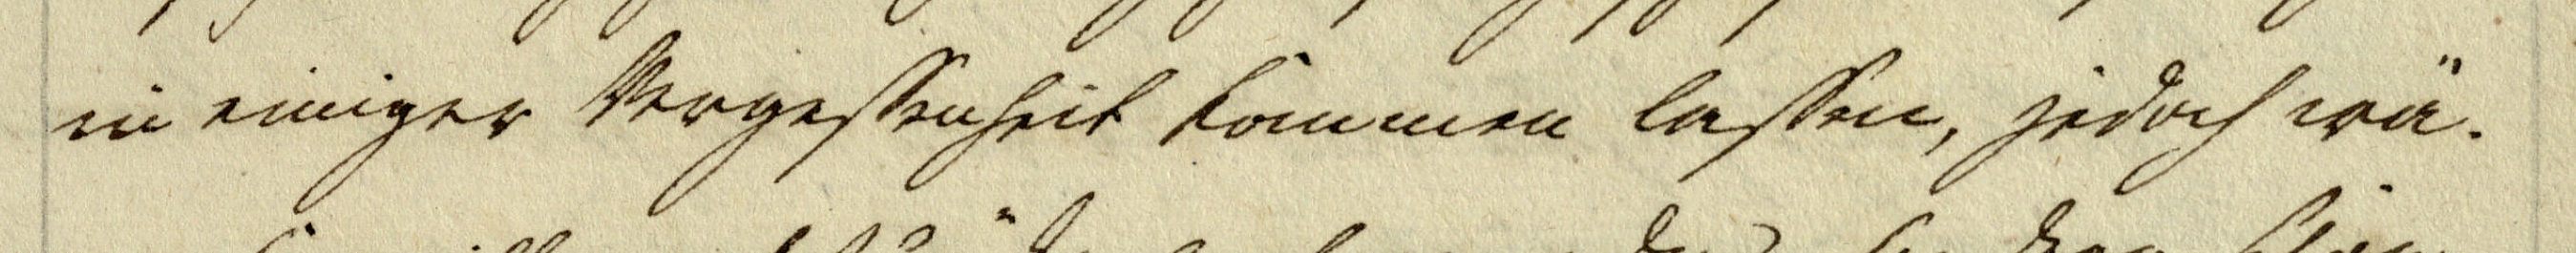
in einiger Vergessenheit kommen lassen, jedoch wä¬
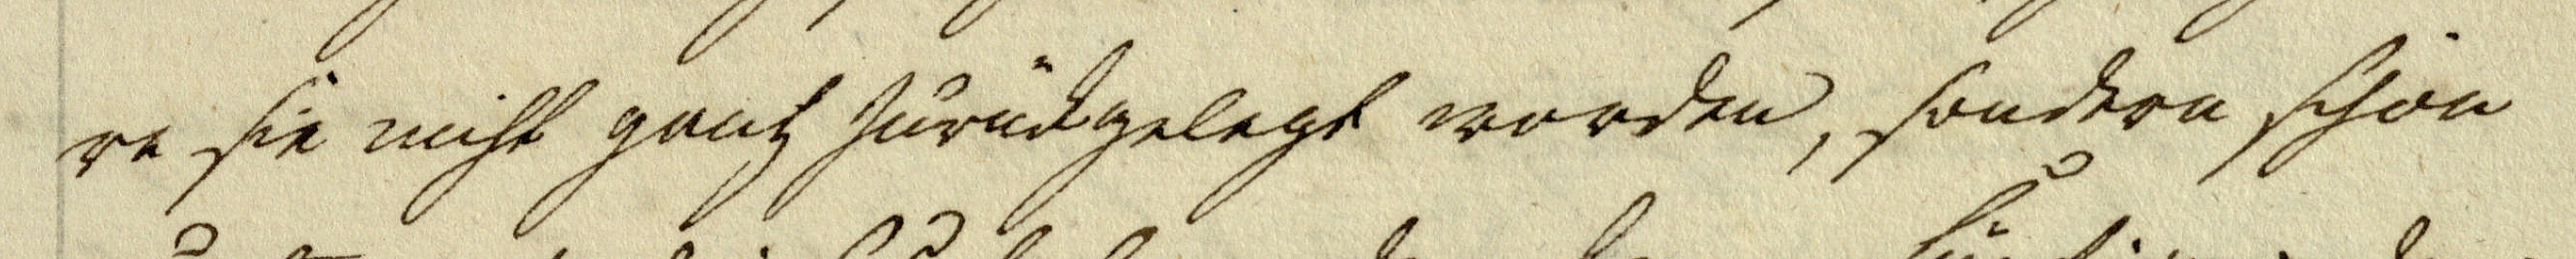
re sie nicht gantz zurückgelegt worden, sondern schon
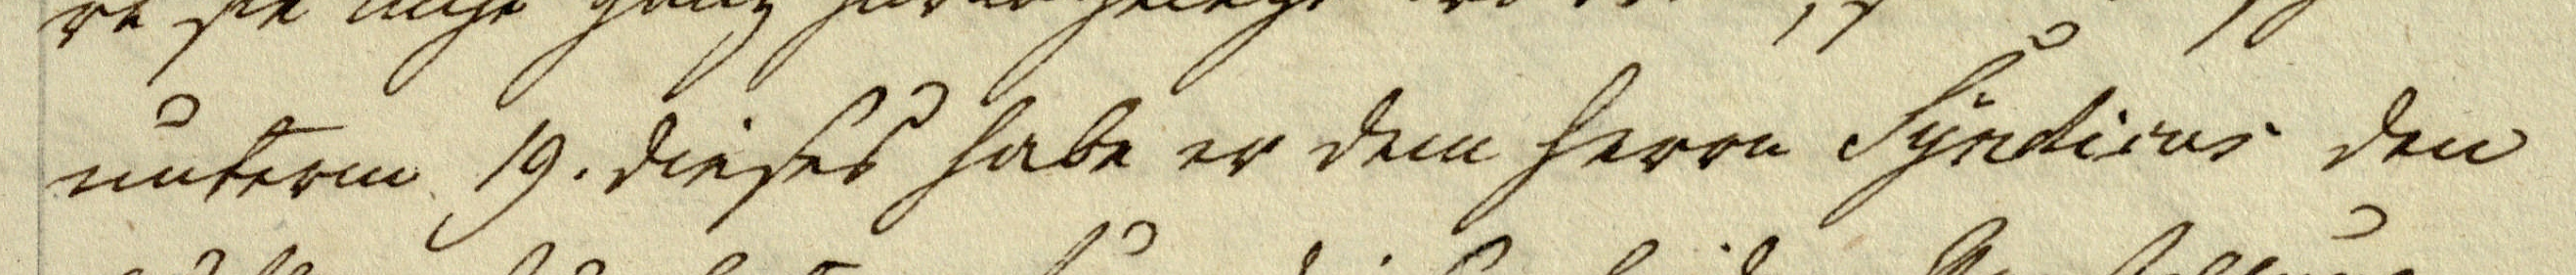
unterm 19. dieses habe er dem Herrn Sÿndicus den
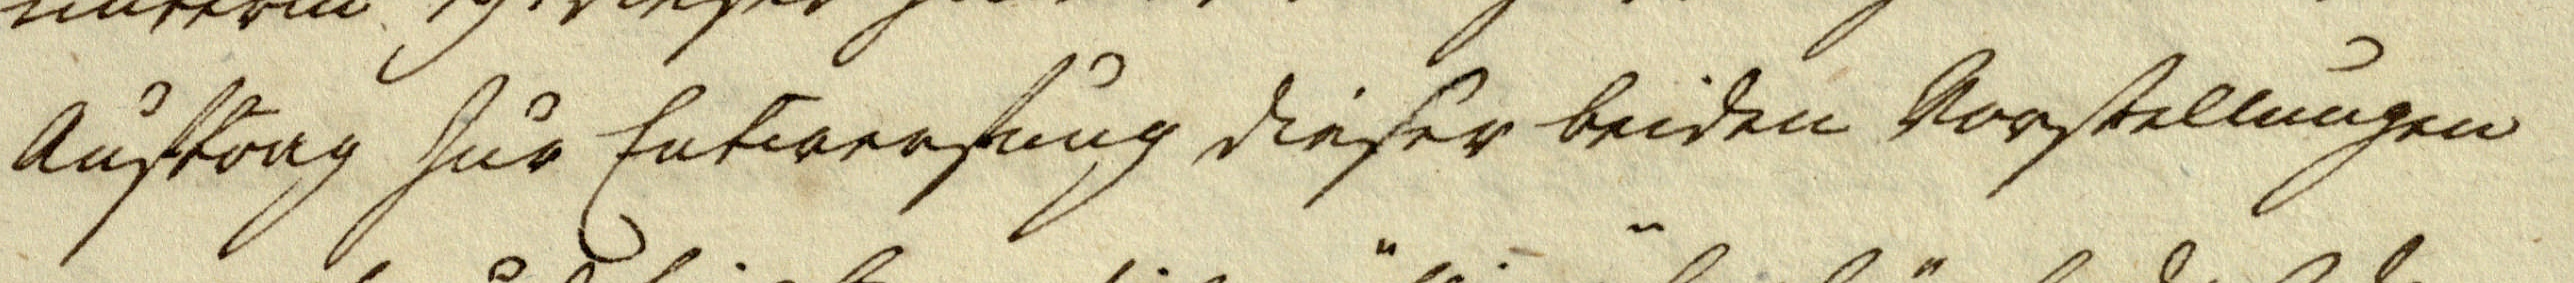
Auftrag zur Entwerfung dieser beiden Vorstellungen
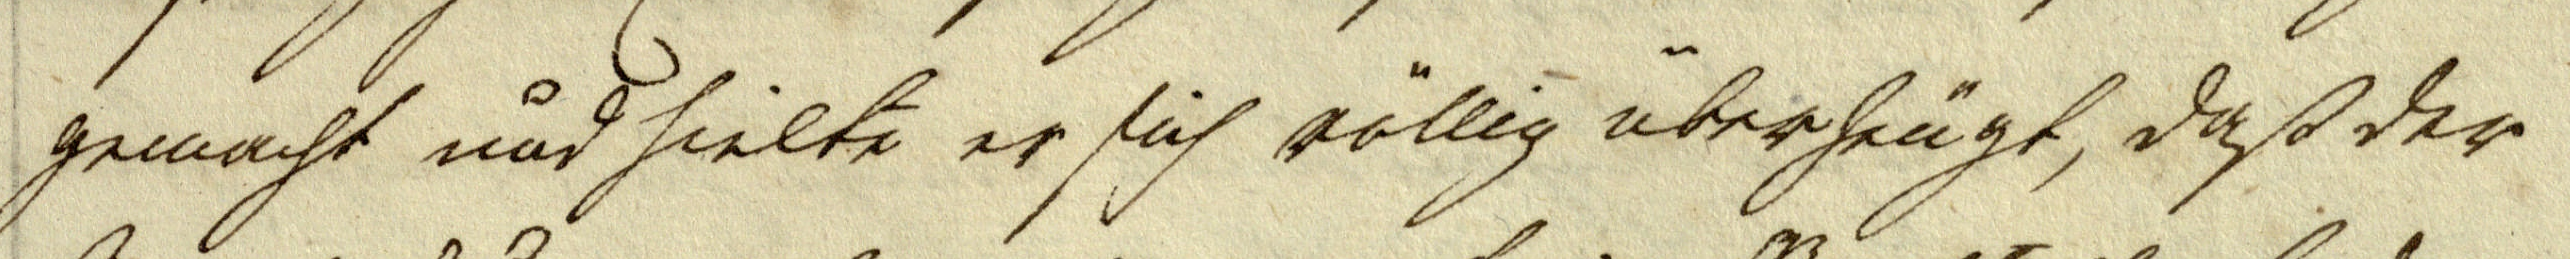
gemacht und hielte er sich völlig überzeugt, daß der
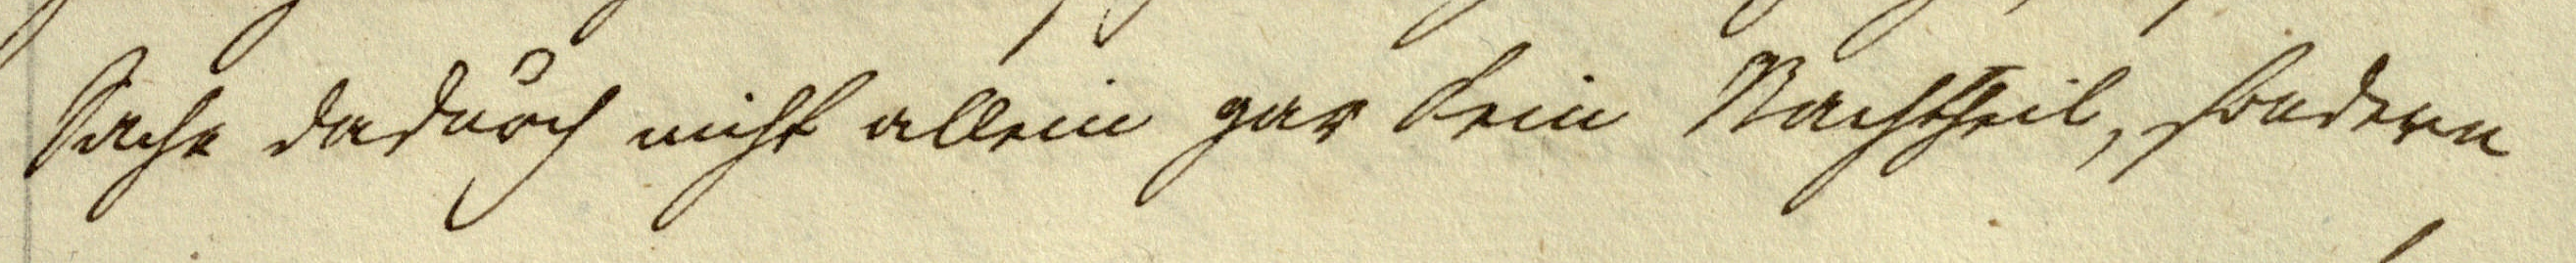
Sache dadurch nicht allein gar kein Nachtheil, sondern
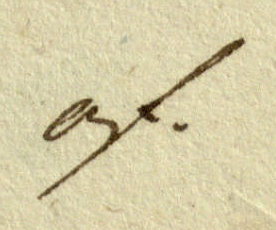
of
